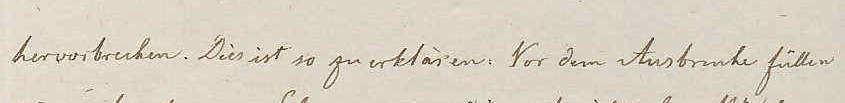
hervorbrechen. Dies ist so zu erklären: Vor dem Ausbruche füllen
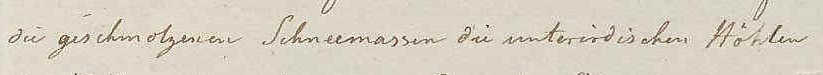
die geschmolzenen Schneemassen die unterirdischen Höhlen
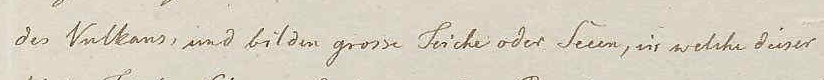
des Vulkans, und bilden grosse Teiche oder Seeen, in welche dieser
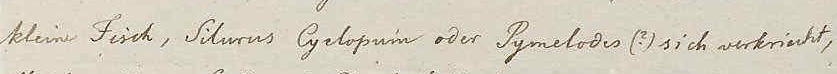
kleine Fisch, Silurus Cyclopum oder Pymelodes sich verkriecht,
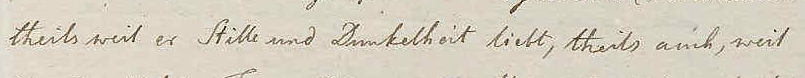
theils weil er Stille und Dunkelheit liebt, theils auch, weil
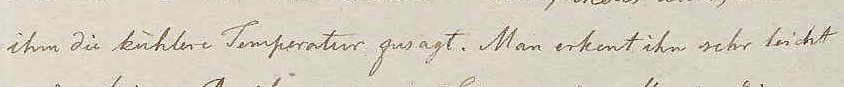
ihm die kühlere Temperatur zusagt. Man erkent ihn sehr leicht
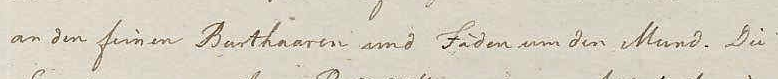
an den feinen Barthaaren und Fäden um den Mund. Die
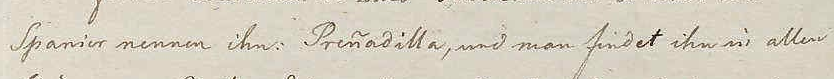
Spanier nennen ihn: Preñadilla, und man findet ihn in allen
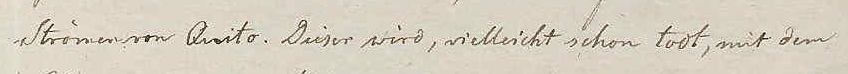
Strömen von Quito. Dieser wird, vielleicht schon todt, mit dem
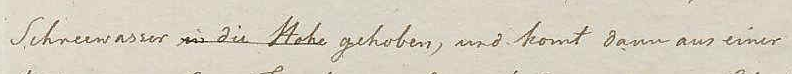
Schneewasser in die Hohe gehoben, und komt dann aus einer
